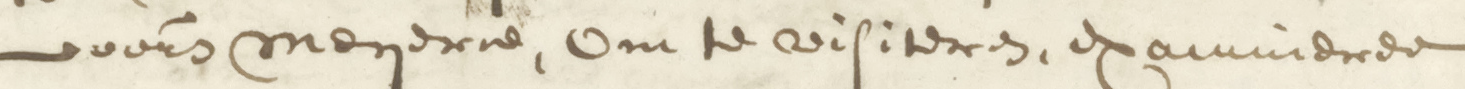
voorn meyerie, om te visiteren, examineren,
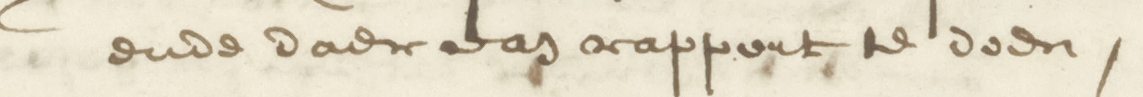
ende daer van rapport te doen.
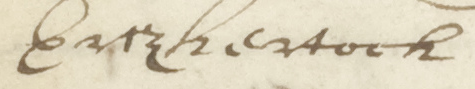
Ertzhertoch
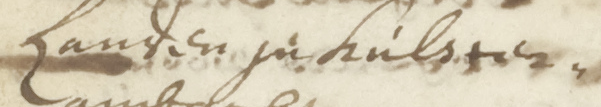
Landen in hulster„
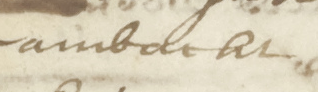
ambacht
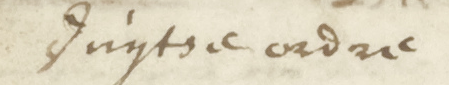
Duytse ordre
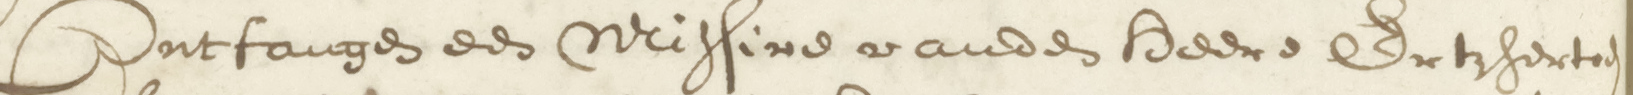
Ontfangen een Missive vanden Heere Ertzhertoch
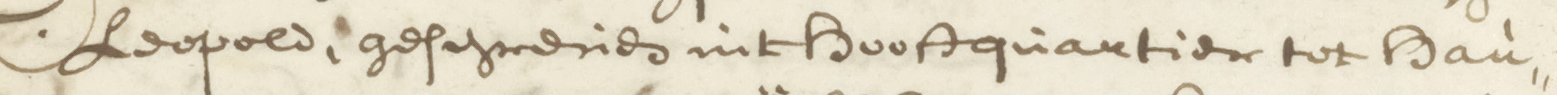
Leopold, geschreven int Hooftquartier tot Hau„
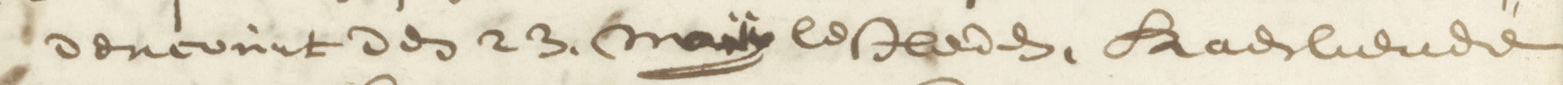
dencourt den 23. martij lestleden, Raeckende
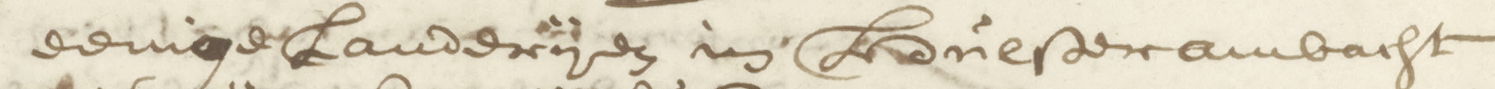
eenige Landerijen in Hulsterambacht
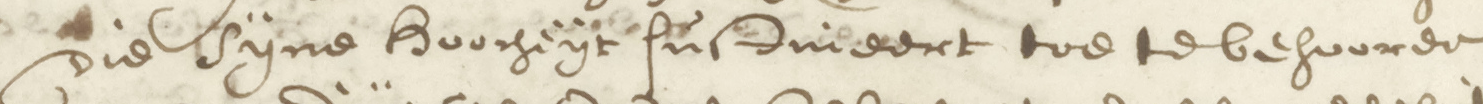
die Sijne Hoocheijt sustineert toe te behooren
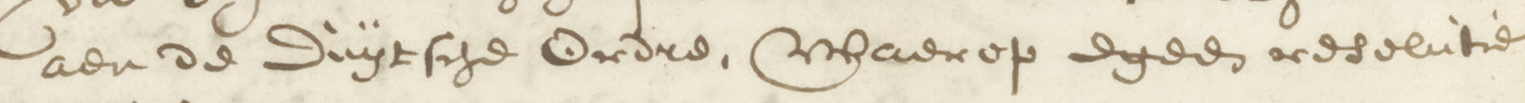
aen de Duijtsche Ordre. Waerop egeen resolutie
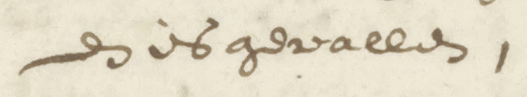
en is gevallen.
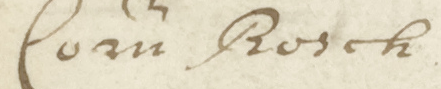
Corn Rosch
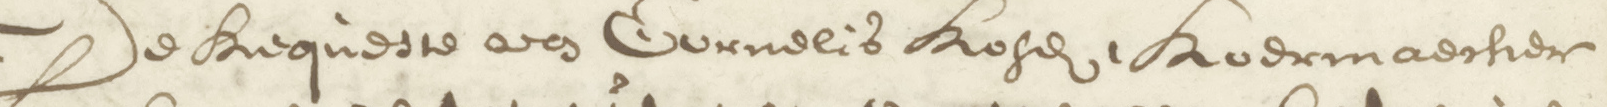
De Requeste van Cornelis Rosch, Roermaecker
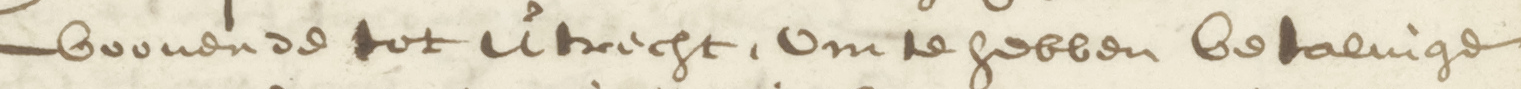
woonende tot Utrecht, om te hebben betalinge
